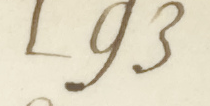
193
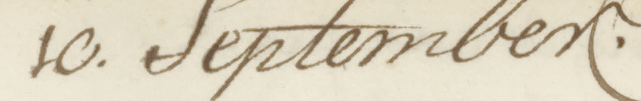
10. September.
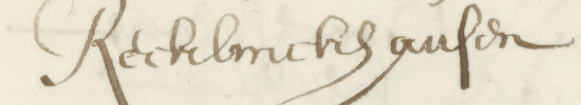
Recklinckhausen
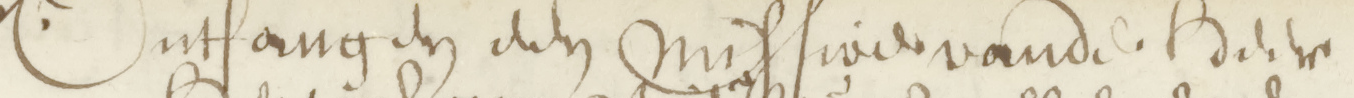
Ontfangen een missive vande Heer
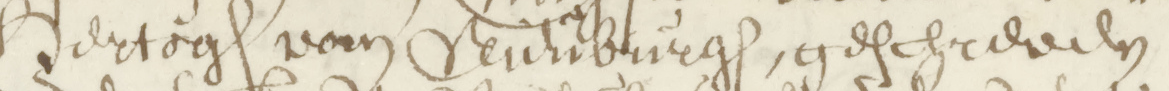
Hertogh van Nieuburgh, geschreven
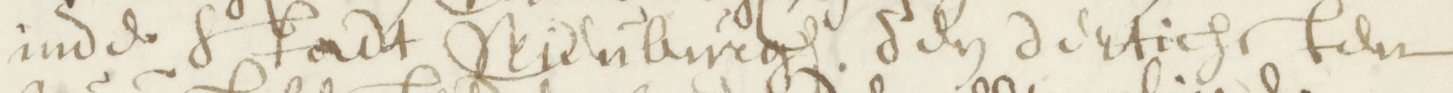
inde Stadt Nieuburgh, den dertichsten
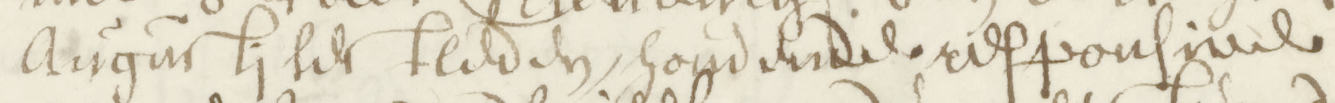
Augusti lestleden, houdende responsive
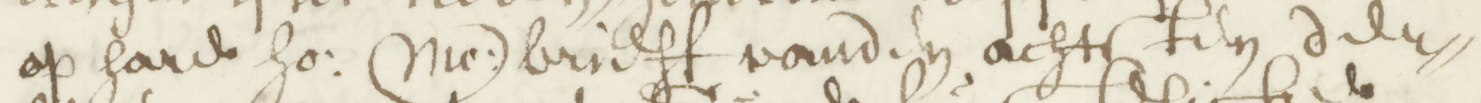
op hare ho:Mo: brieff vanden achtsten der„
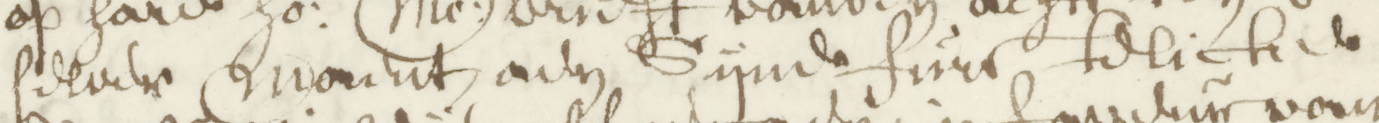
selver Maent, aen Sijne furstelicke
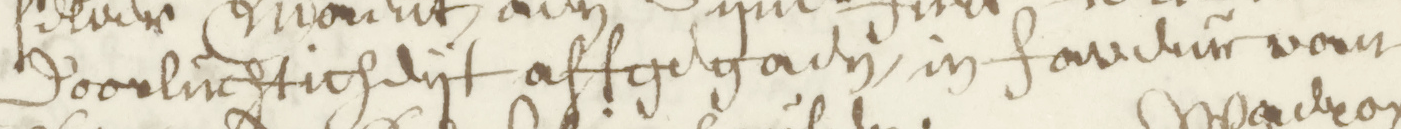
Doorluchticheijt affgegaen, in faveur van
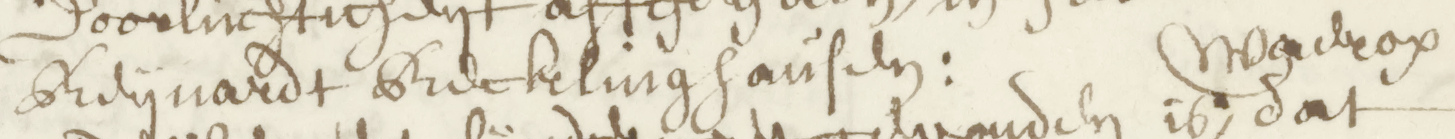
Reijnardt Recklinghausen: Waerop
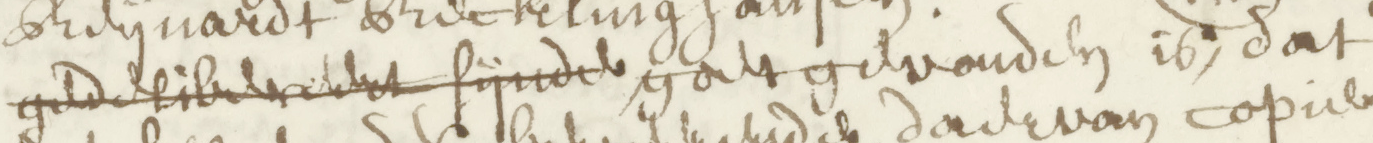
gedelibereert sijnde goetgevonden is, dat
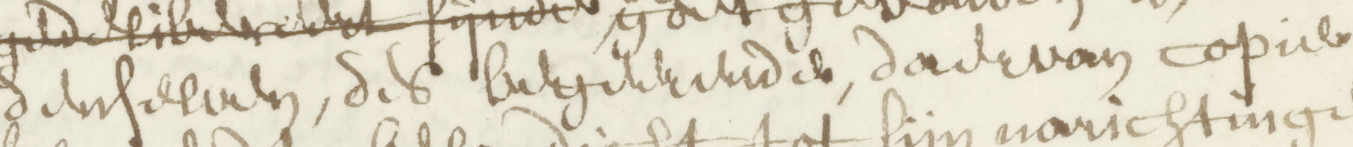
denselven, des begeerende, daervan copie
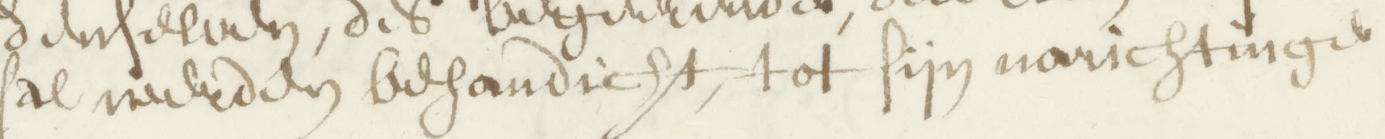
sal werden behandicht, tot sijn narichtinge.
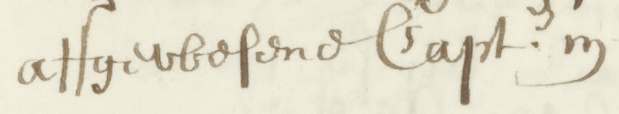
affgewesene Capten. in
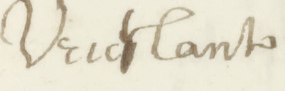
Vrieslant
